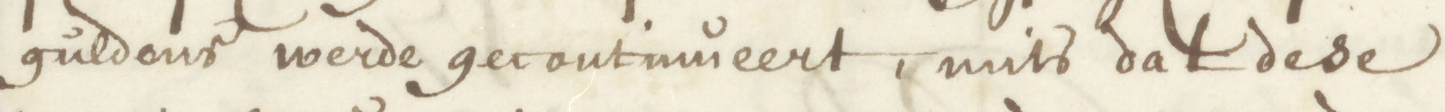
guldens werde gecontinueert, mits dat dese
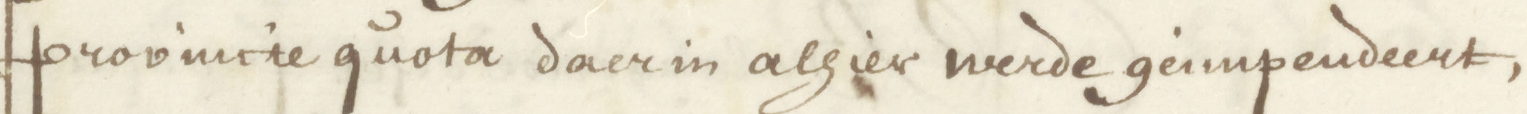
provincie quota daer in alhier werde geimpendeert.
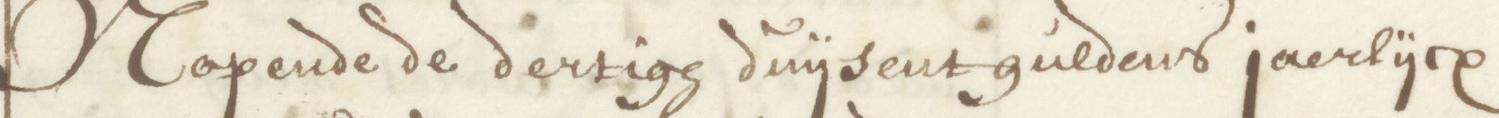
Nopende de dertigh duijsent guldens jaerlijcx
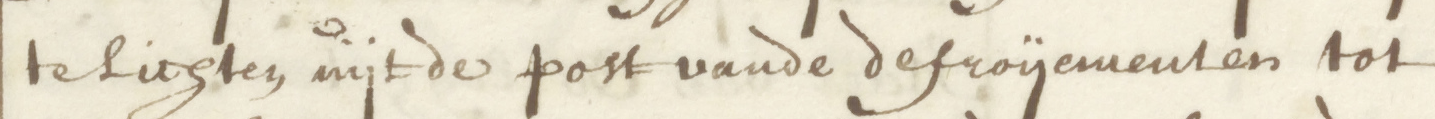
te lichten uijt de post vande defroijementen tot
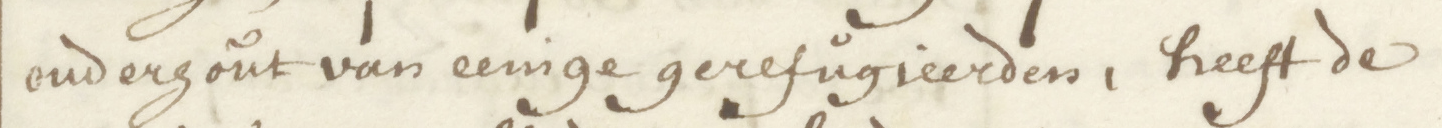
onderhout van eenige gerefugieerden, heeft de
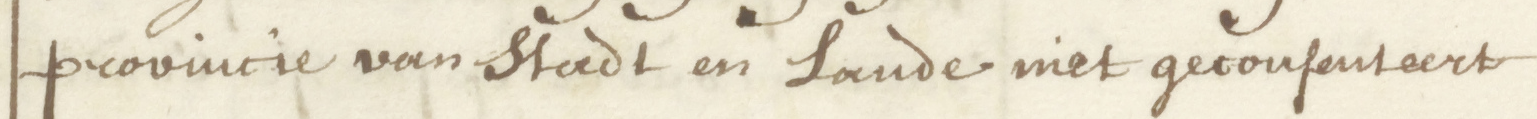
provincie van Stadt en Lande niet geconsenteert
